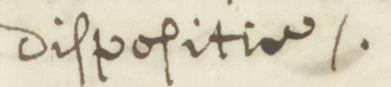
dispositie.
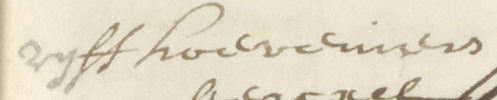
vijff hoeveniers
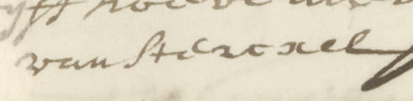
van stercxel
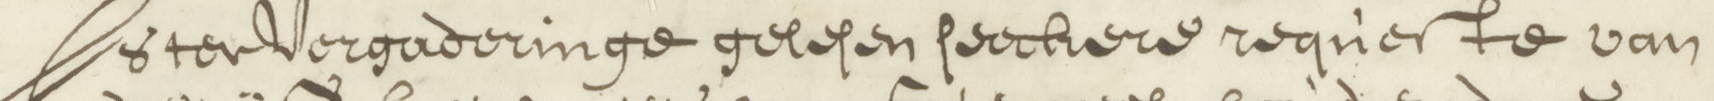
Is ter Vergaderinge gelesen seeckere requeste van
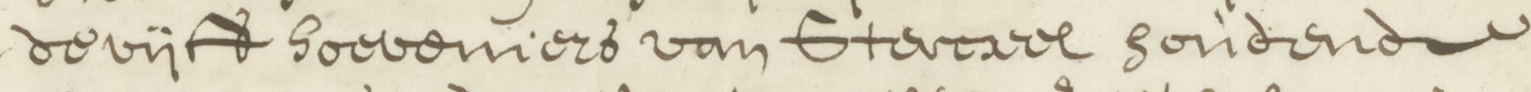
de vijff hoeveniers van Stercxel houdende
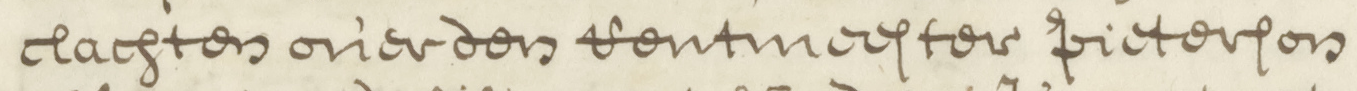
clachten over den Rentmeester Pieterson;
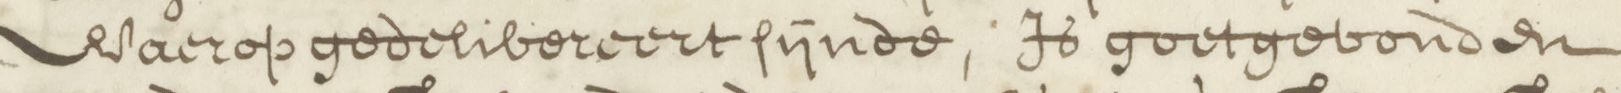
Waerop gedelibereert sijnde, Is goetgevonden
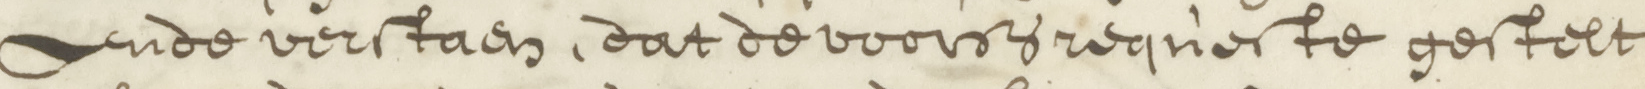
ende verstaen, dat de voors requeste gestelt
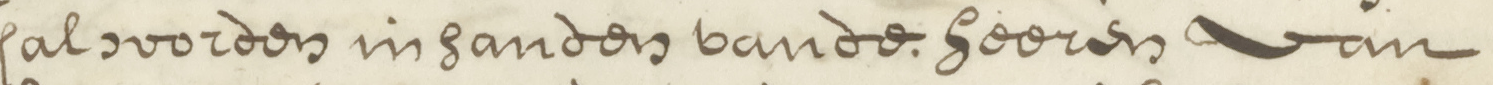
sal worden in handen vande heeren van
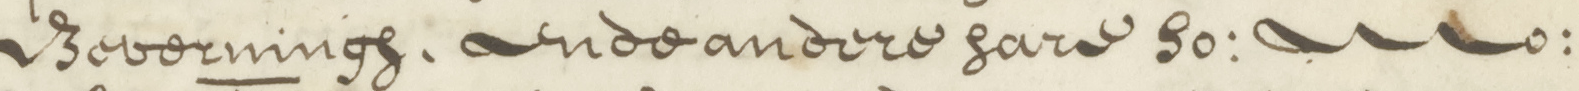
Beverningh, ende andere hare ho:Mo:
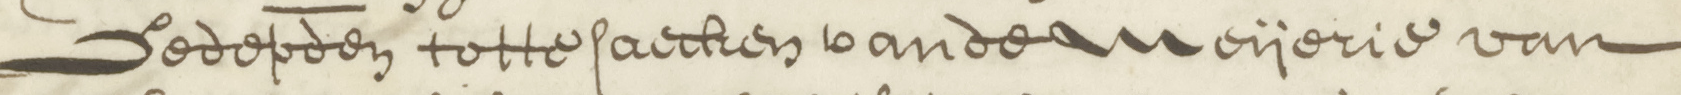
Gedepden totte saecken vande Meijerie van
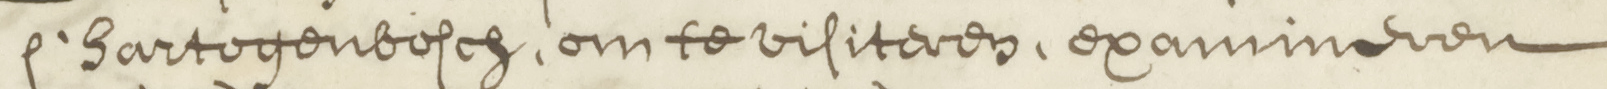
s'hartogenbosch, om te visiteren, examineren
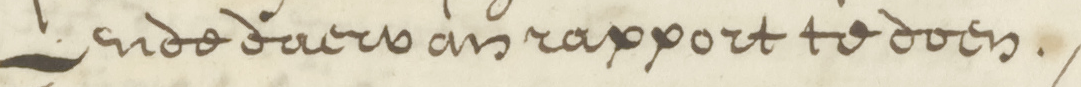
Ende daervan rapport te doen.
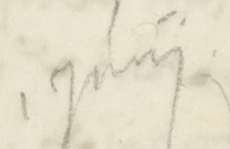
1 Junij
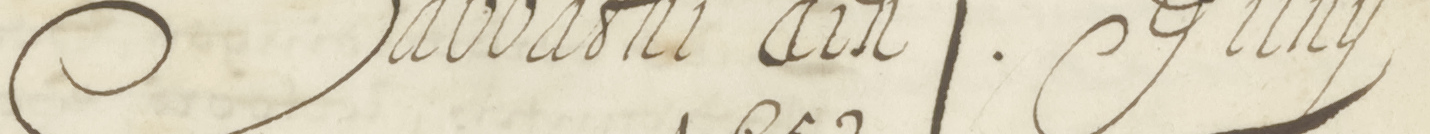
Sabbatti den i. Junij
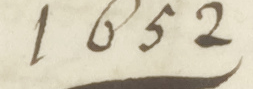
1652
